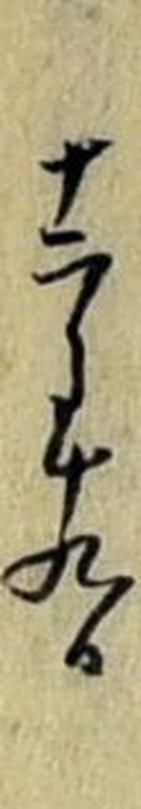十二月十九日
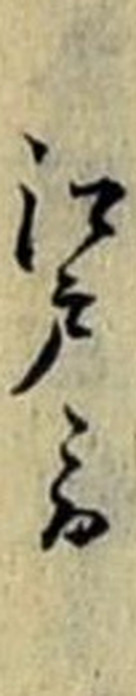江戸ニ而
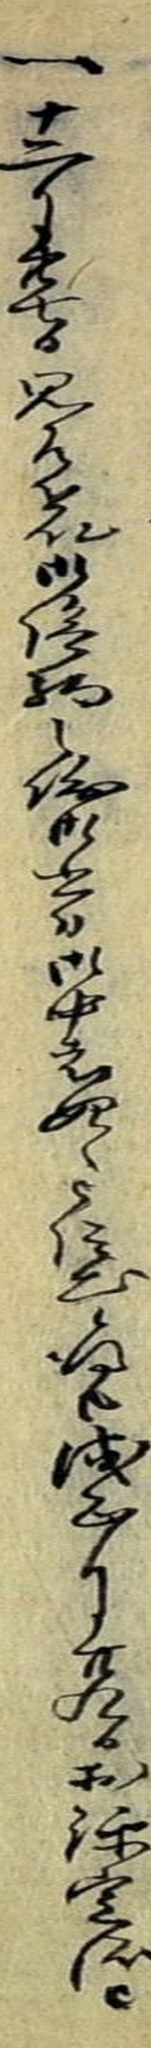一十二月廿七日思召を以御倹約之儀御書付御中老始へ被仰出候得共戌正月廿九日於評定所被
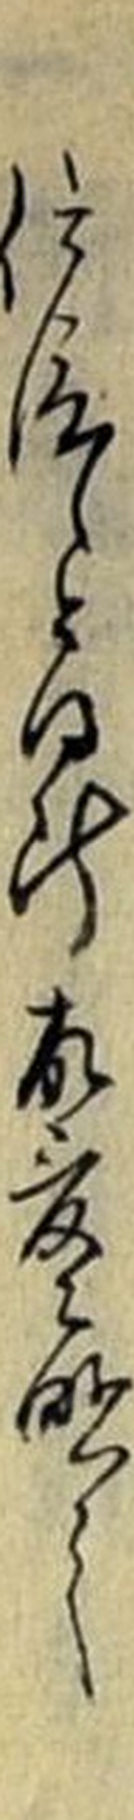仰渡候と同断故爰ニ略之
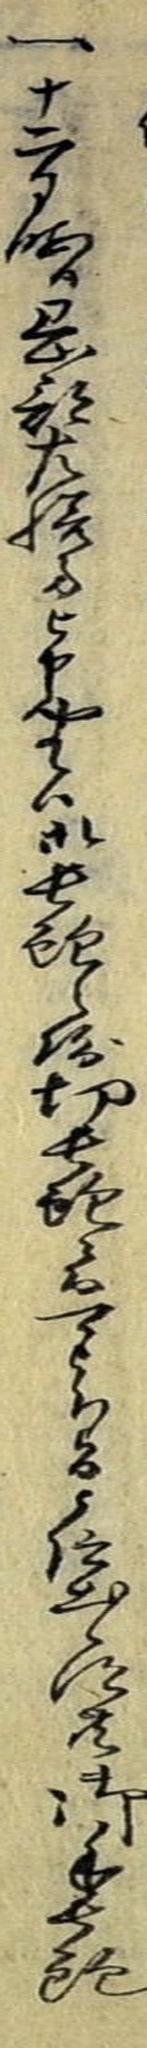一十二月晦日岡部左膳方被申聞候ハ御長鮑之儀切長鮑ニ而可被下旨被仰出候得共御手長鮑
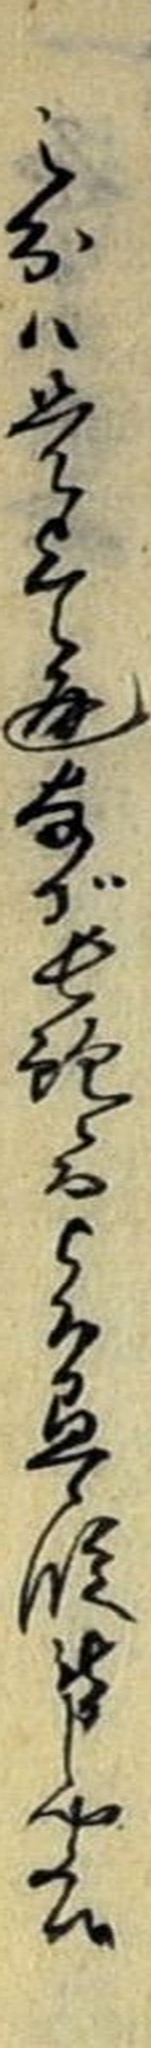之分ハ是迄之通なが長鮑ニ而被下置候段被申聞候
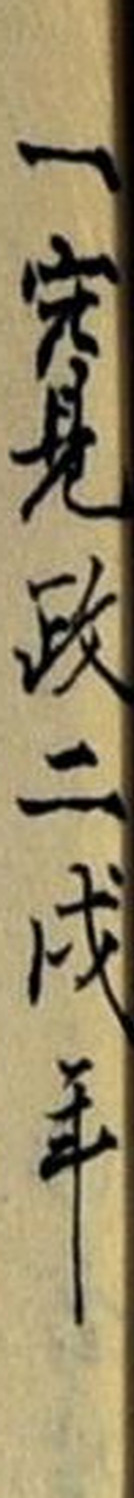寛政二戌年
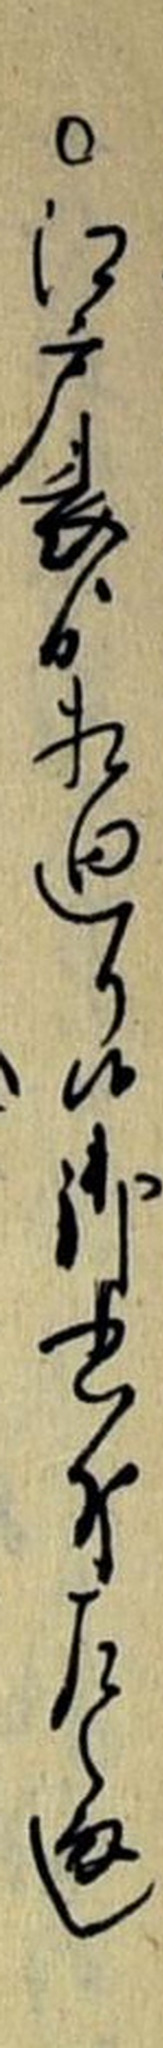〇江戸表ゟ相廻り候御書付左之通
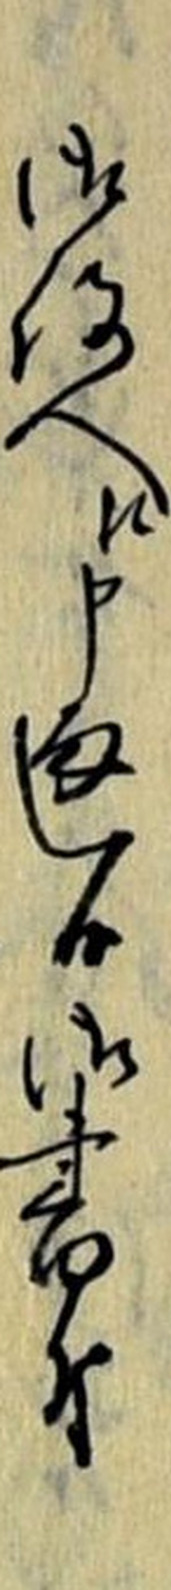御役人江申通候御書付
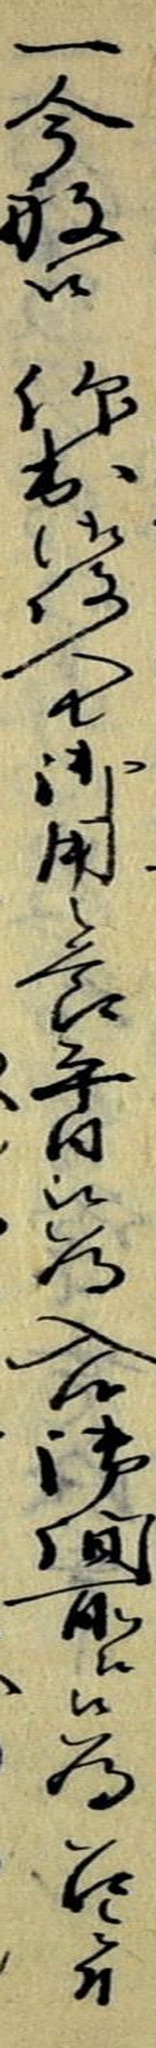一今般被仰出御役人共御用之節平日被為入候御間所江被為召候ニ付
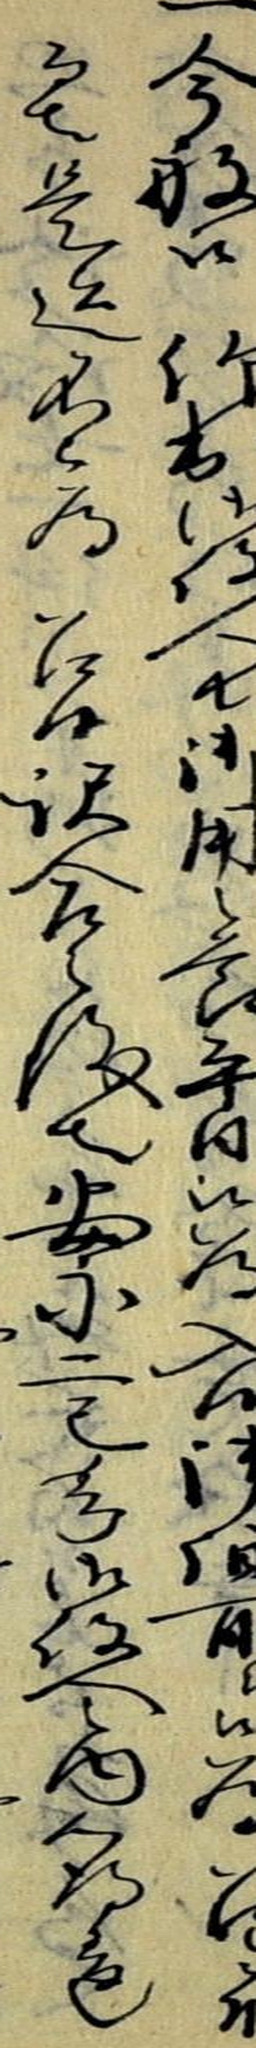而者是迄不被為召候訳合之儀者安永二巳年御役人之内心得違
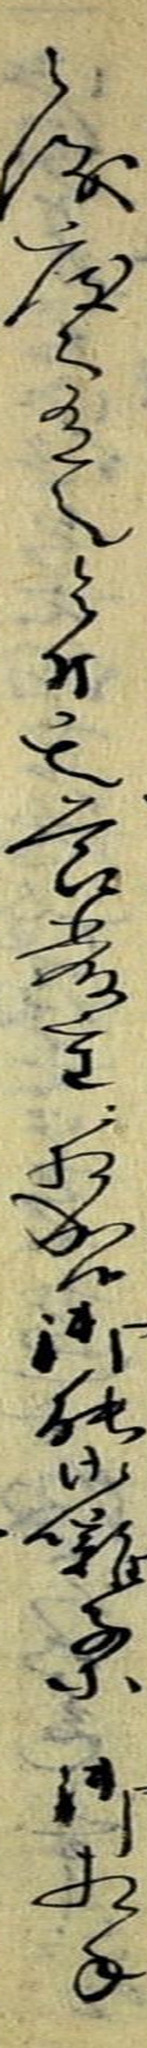之儀度々有之候ニ付其節厳重ニ相成候御能御囃子等御相手
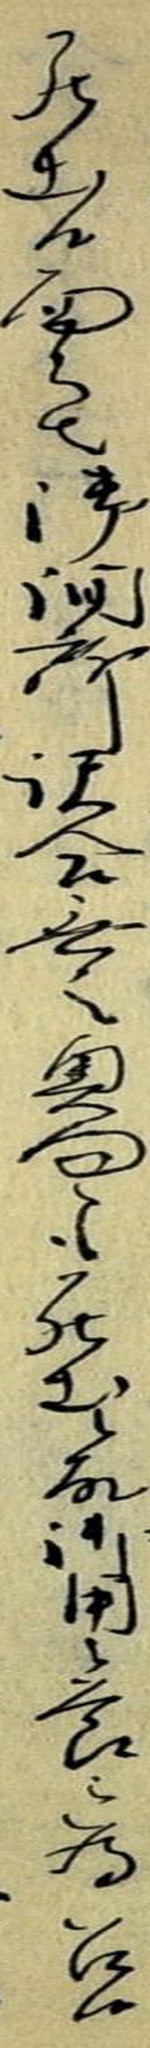罷出候面々者御間所訳合無之奥向へも罷出候故御用之節被為召候
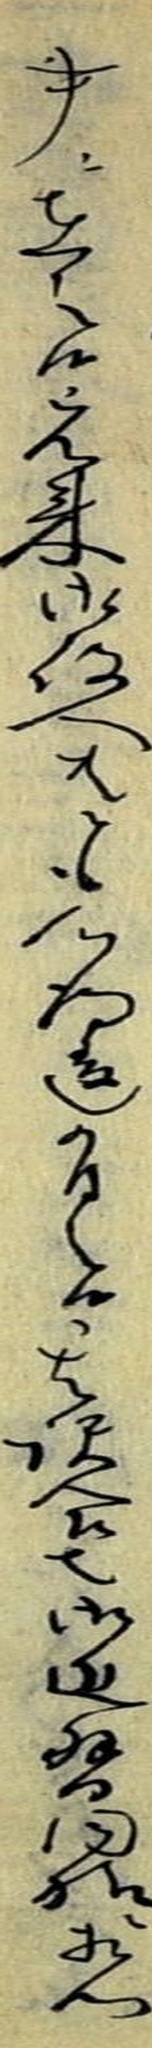事ニ在之候元来御役人共ニも心得違有之候其訳合者御近習同様ニ相心
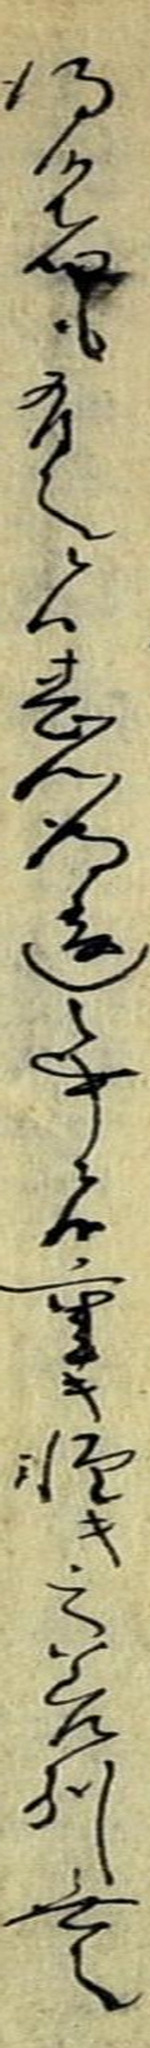得候者も有之候ハ甚心得違之事ニ候重キ軽キ之差別無之
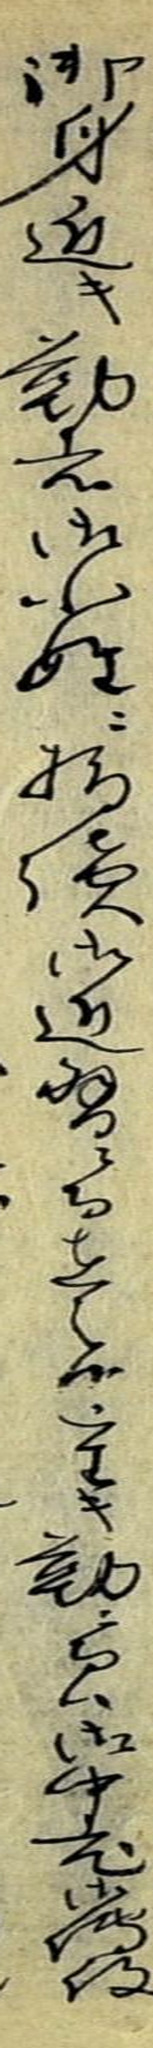御身近キ勤者御小姓ニ指御近習ニ而在之候重キ勤ニ而ハ御中老御傅役
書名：命令之部 三
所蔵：福井県文書館 Fukui Prefectural Archives
